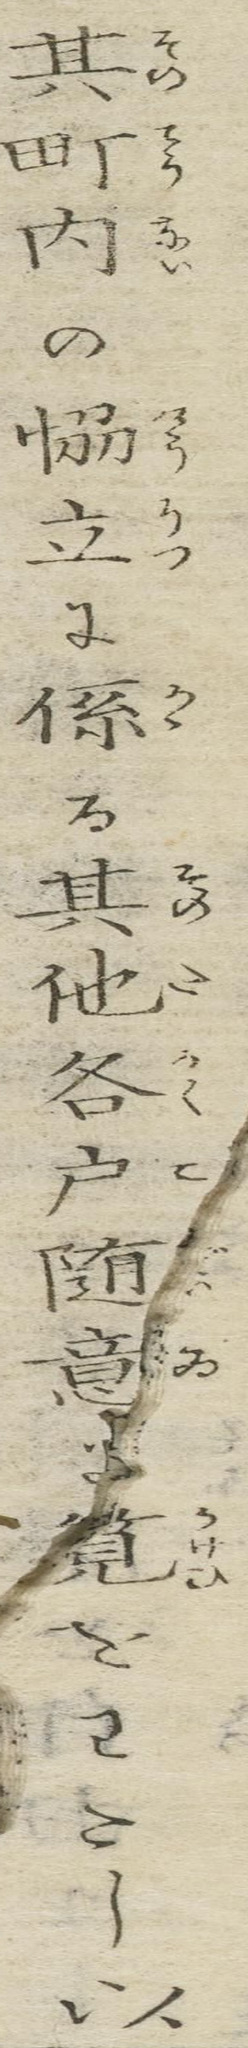其町内の協立に係る其他各戸随意に筧をわたし以
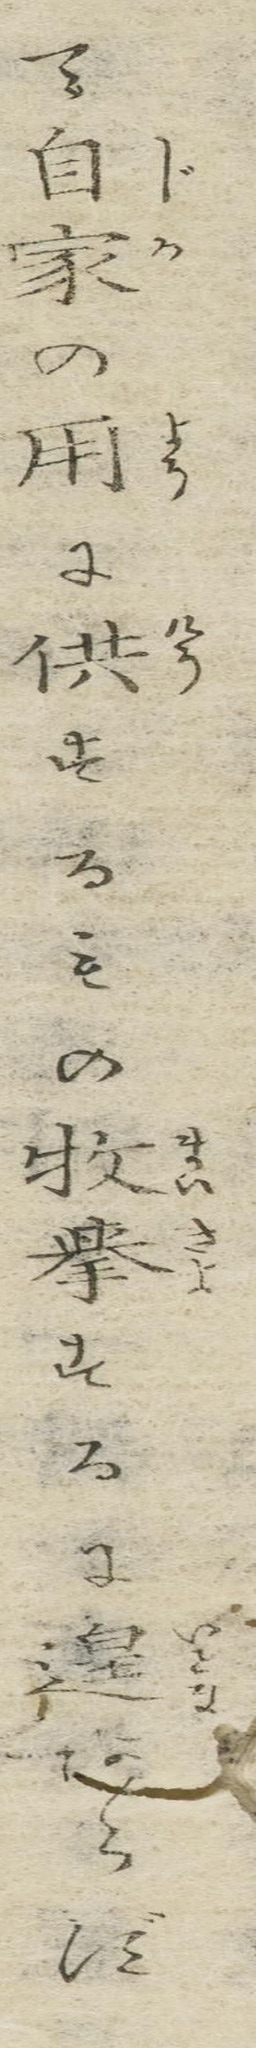て自家の用に供するもの枚挙するに遑あらず
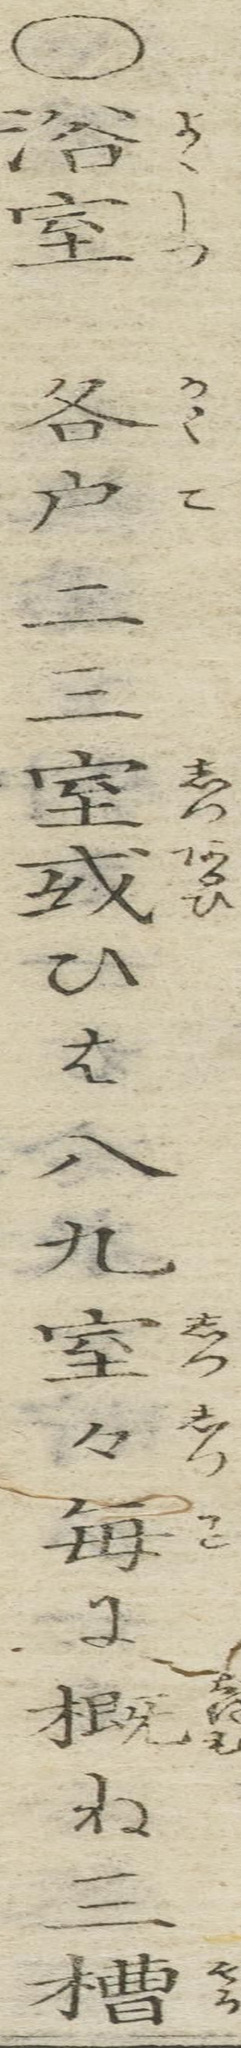○浴室各戸二三室或ひは八九室々毎に概ね三槽

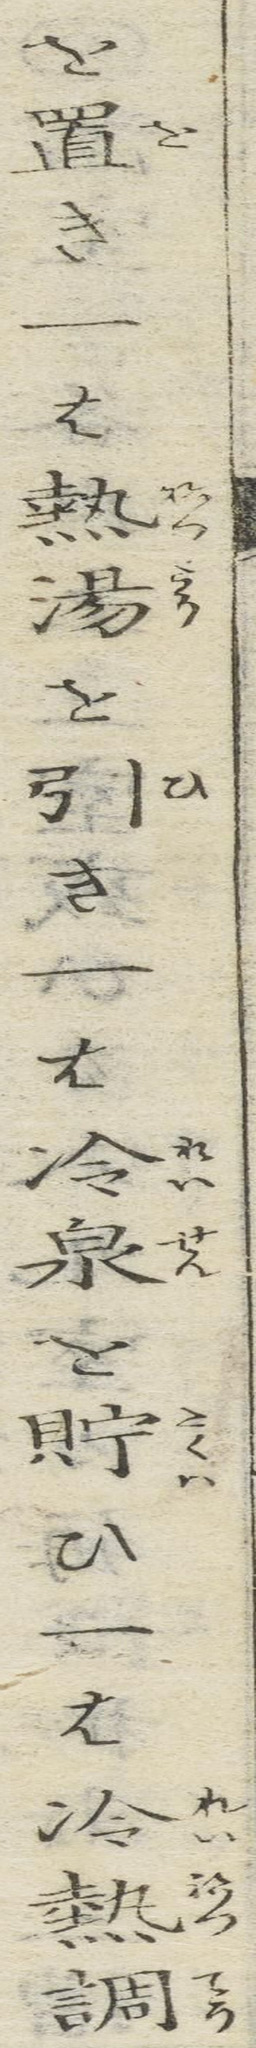を置き一は熱湯を引き一は冷泉を貯ひ一は冷熱調
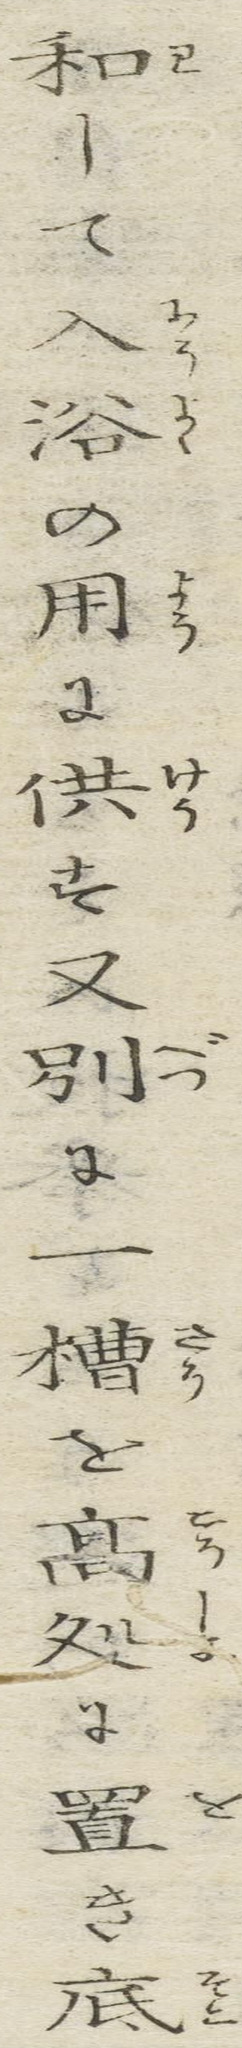和して入浴の用に供す又別に一槽を高処に置き底
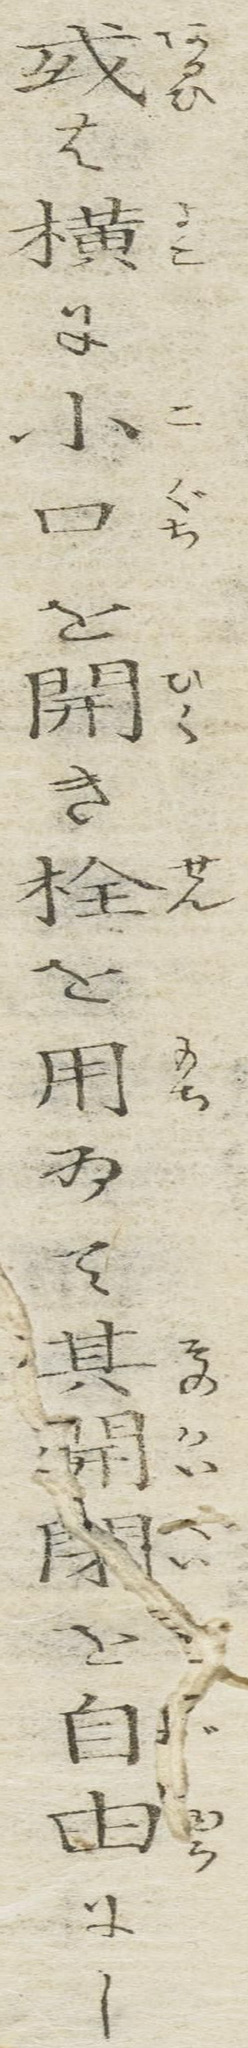或は横に小口を開き栓を用ゐて其開閉を自由にし
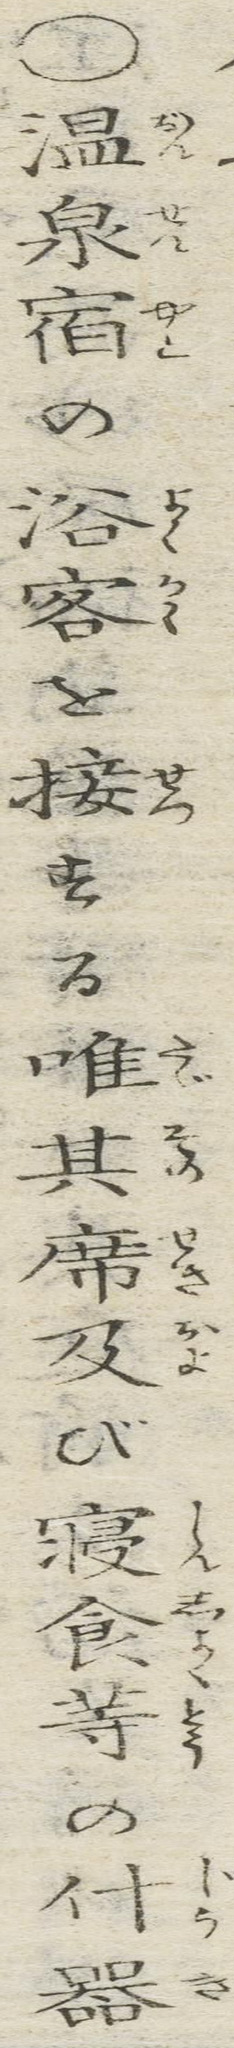○温泉宿の浴客を接する唯其席及び寝食等の什器
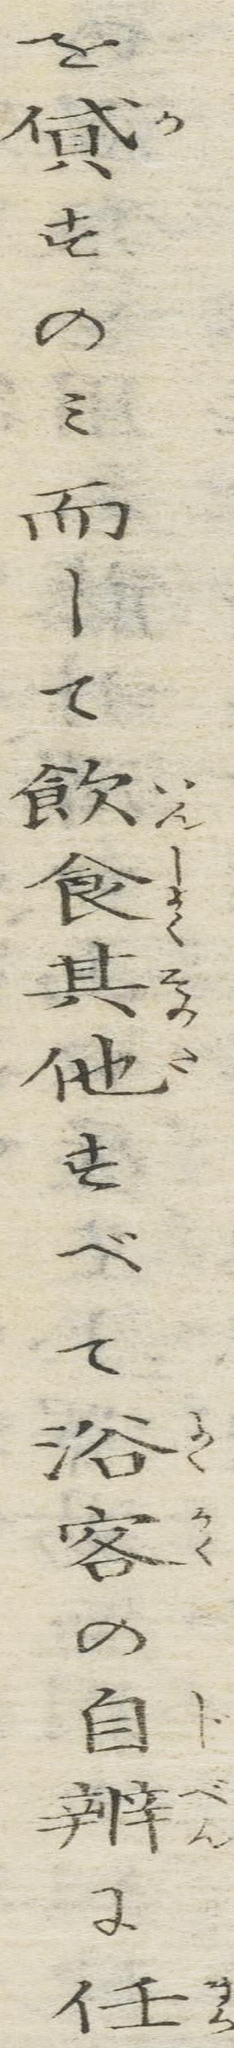を貸すのみ而して飲食其他すべて浴客の自弁に任
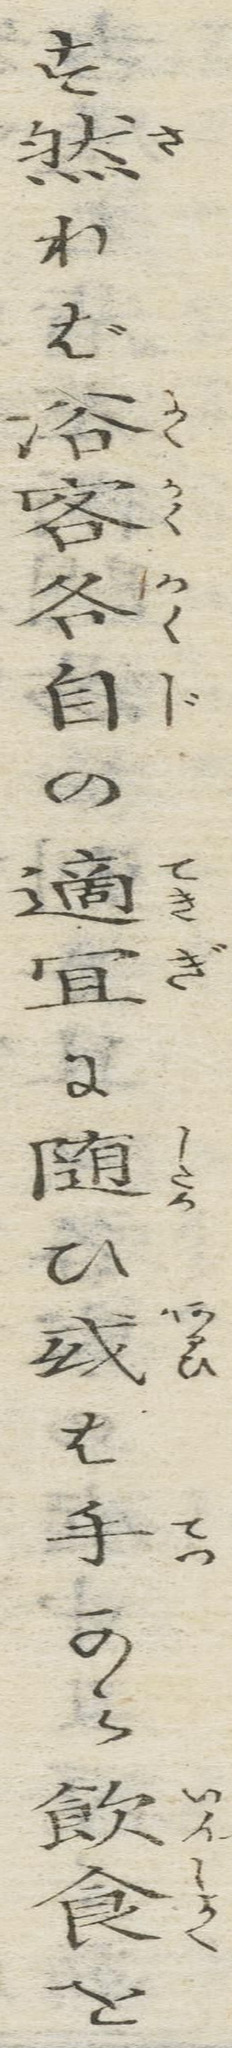す然れば浴客各自の適宜に随ひ或は手から飲食を
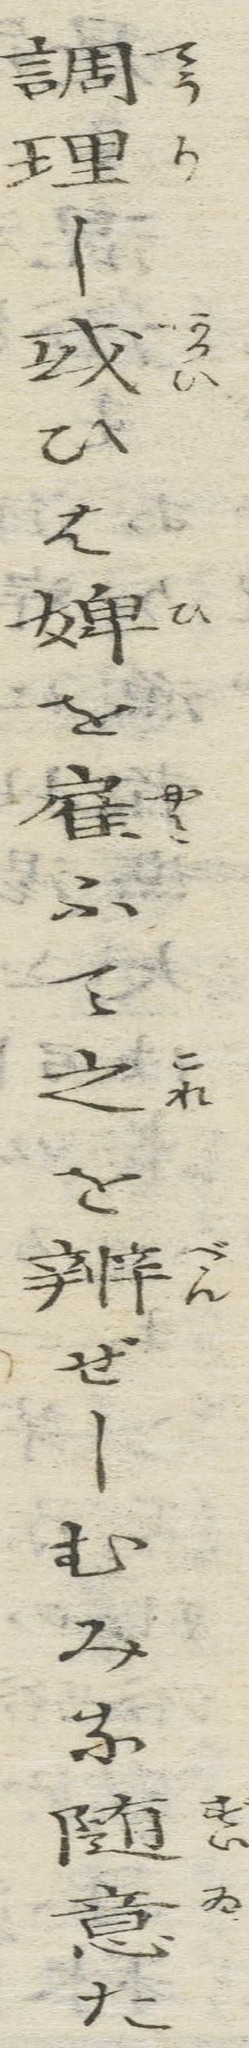調理し或ひは婢を雇ふて之を弁ぜしむみな随意た
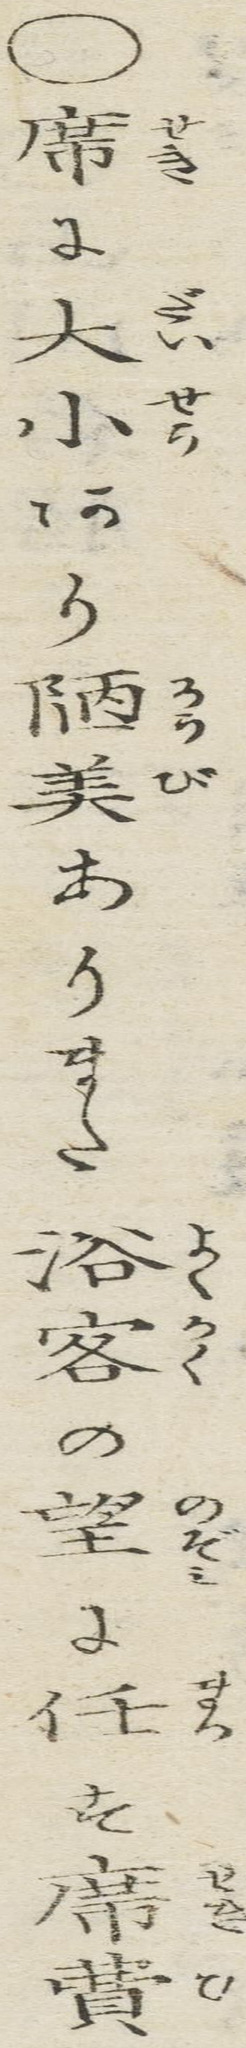○席に大小あり陋美ありまた浴客の望に任す席費
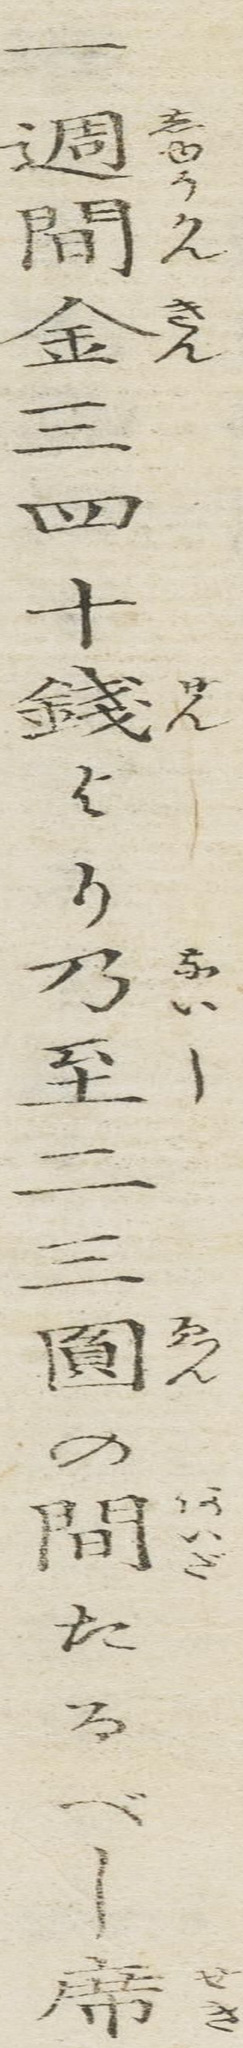一週間金三四十銭より乃至二三圓の間たるべし席
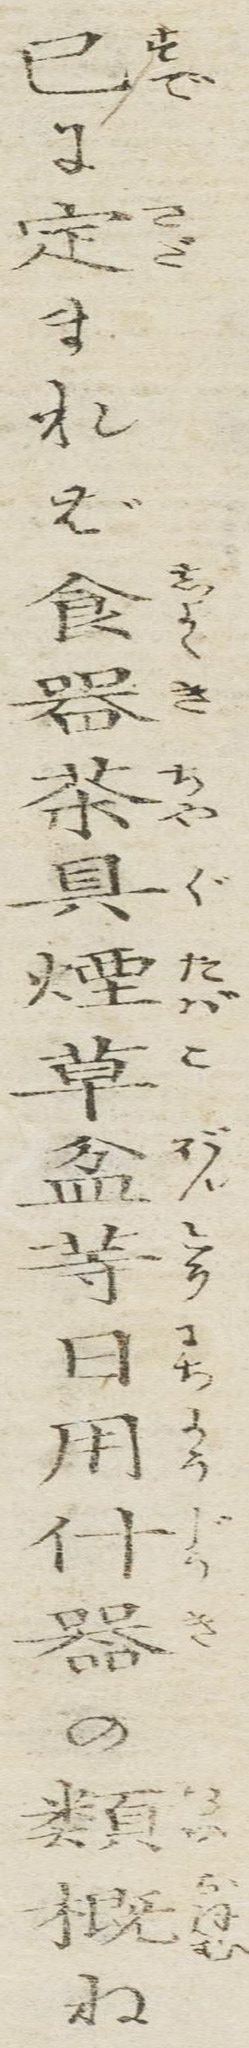巳に定まれば食器茶具煙草盆等日用什器の類概ね
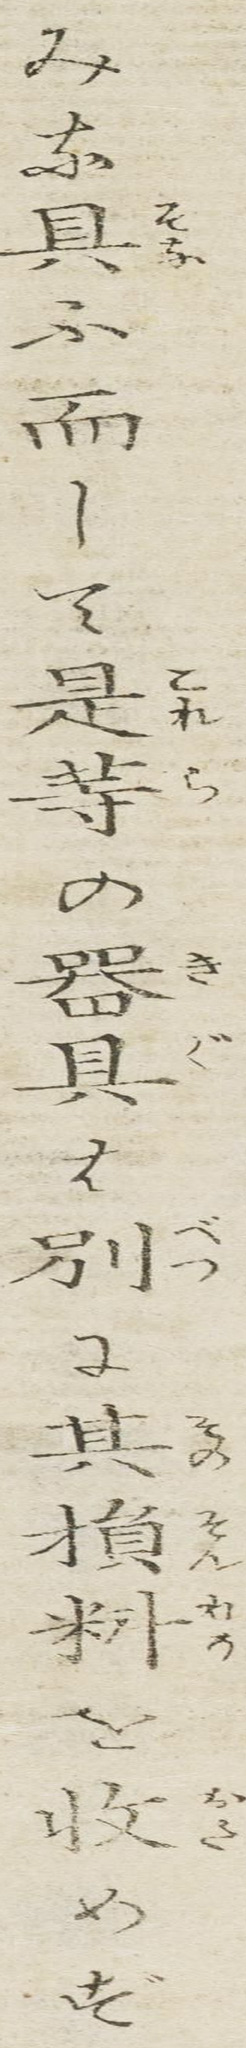みな具ふ而して是等の器具は別に其損料を収めず
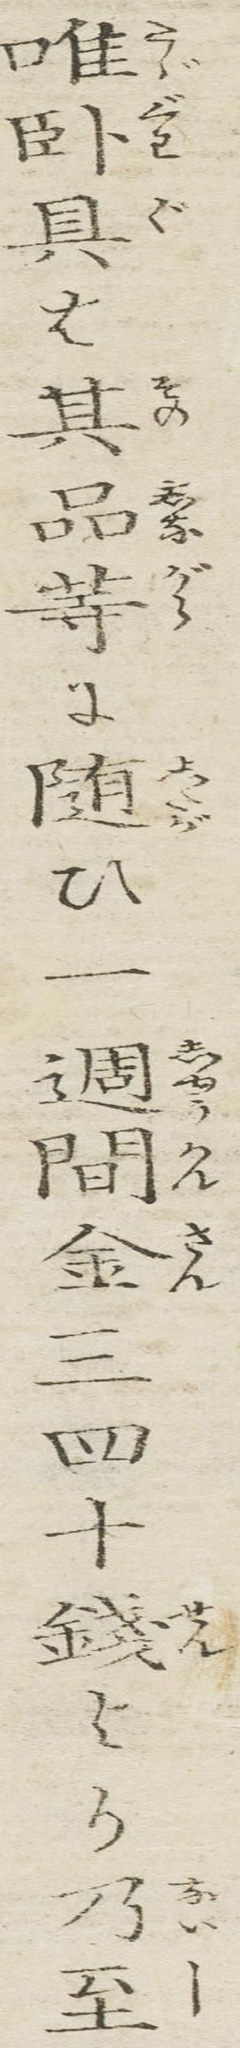唯臥具は其品等に随ひ一週間金三四十銭より乃至
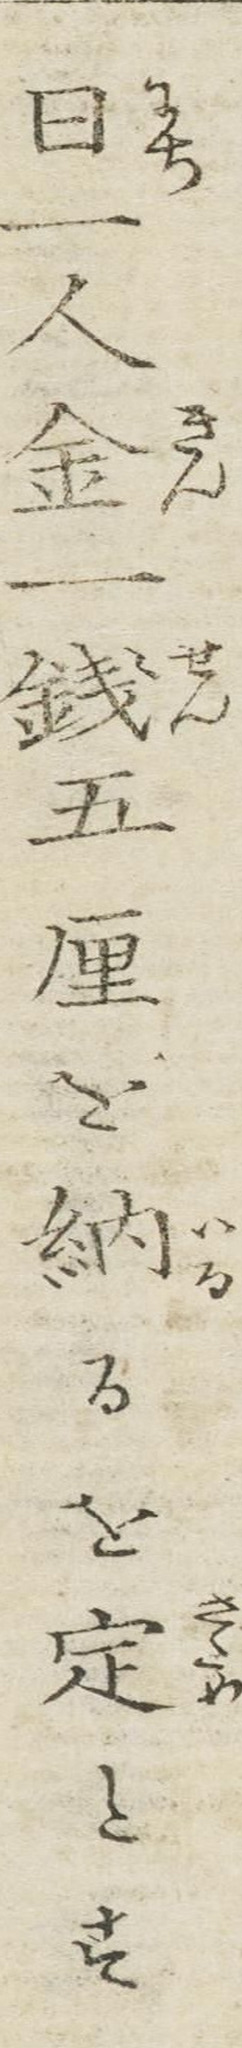日一人金一銭五厘を納るを定とす
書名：豆州熱海誌　完
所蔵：東京大学地震研究所図書室 Earthquake Research Institute Library, The University of Tokyo, JAPAN
